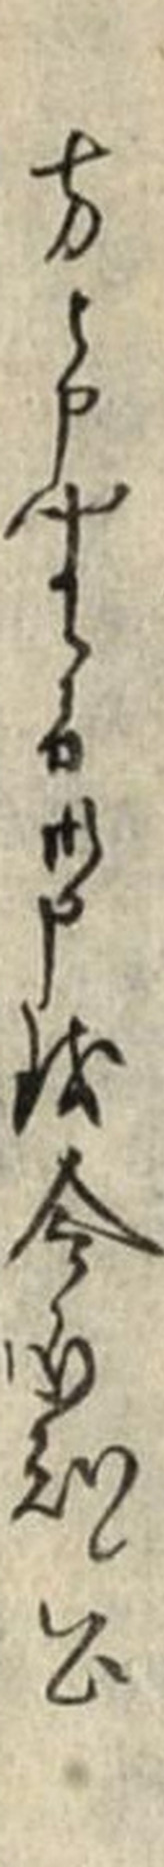方被申聞候ニ付御申越令承知候以上
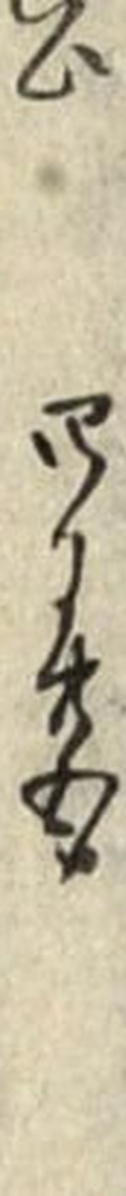四月廿五日
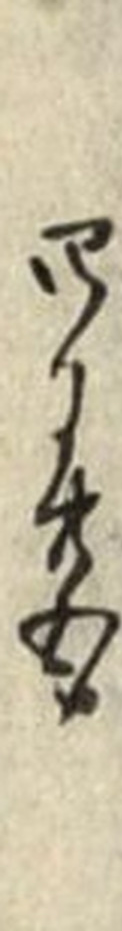四月廿五日
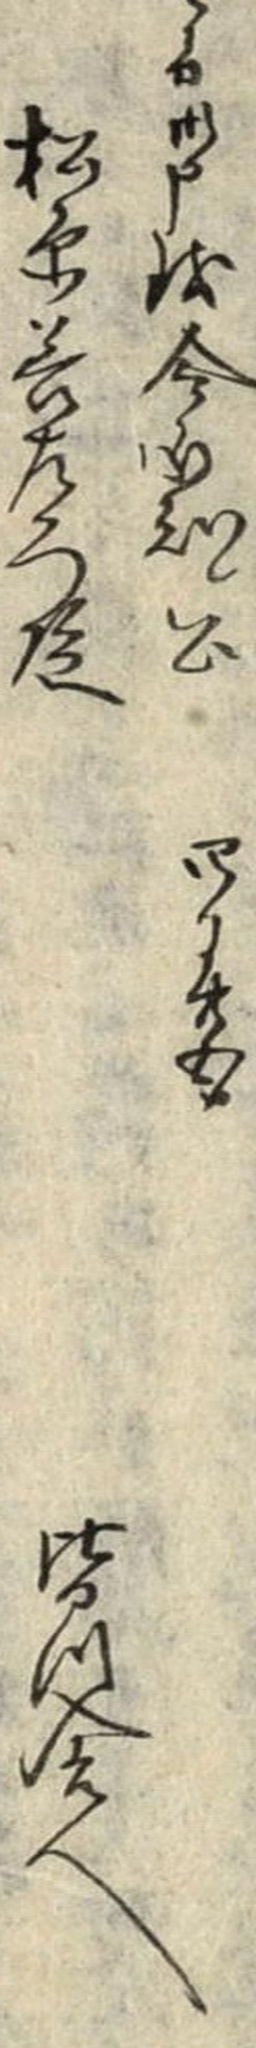松原善左衛門殿皆川舎人
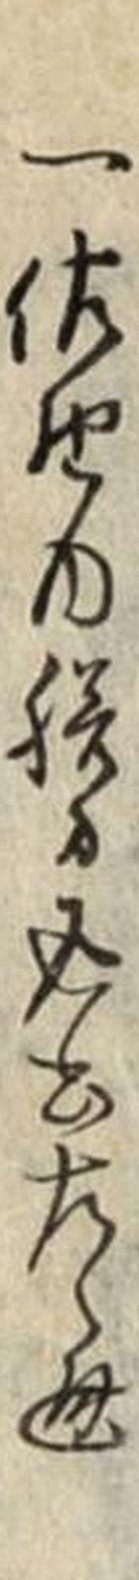一佐野内膳方返書左之通
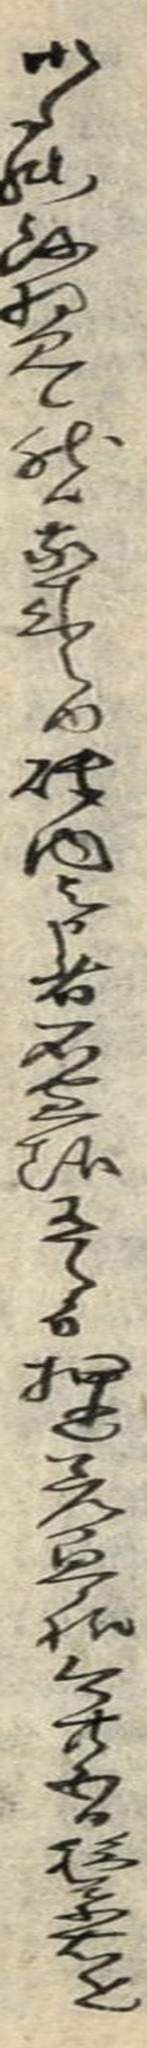御手紙致拝見候然は家来之内磯内と申者不宜趣有之候ニ付押込差置候様今廿五日稻葉右近
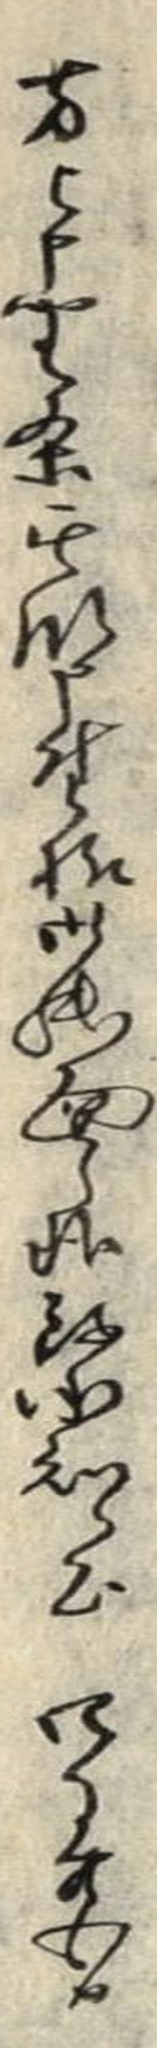方被申聞候条其段申付候様御紙面之趣致承知候以上
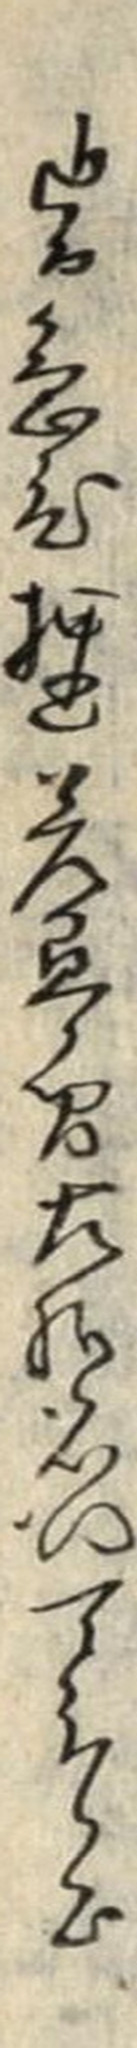追而急度押込差置候間左様御心得可被下候以上
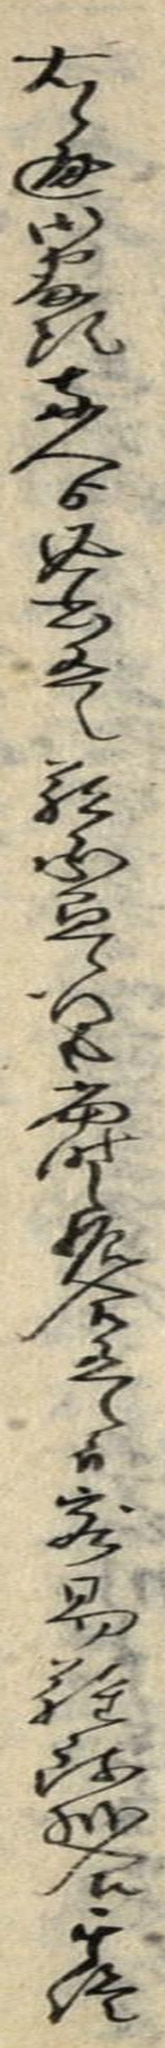右之通御番頭両人ゟ返書有之難承置候得共当時之振合有之候に付容易難致掛合其侭
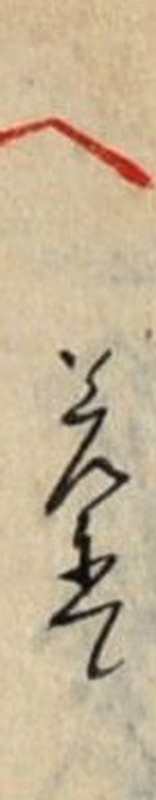差置候
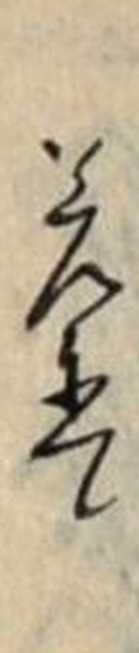差置候

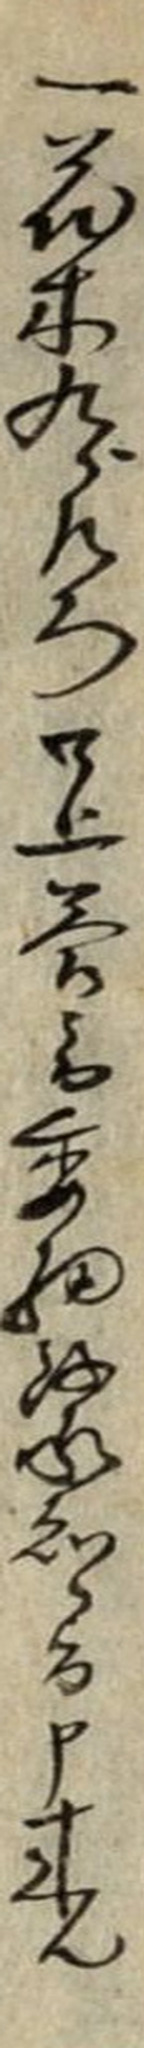花木九郎左衛門口上答に而委細致承知候旨申来る
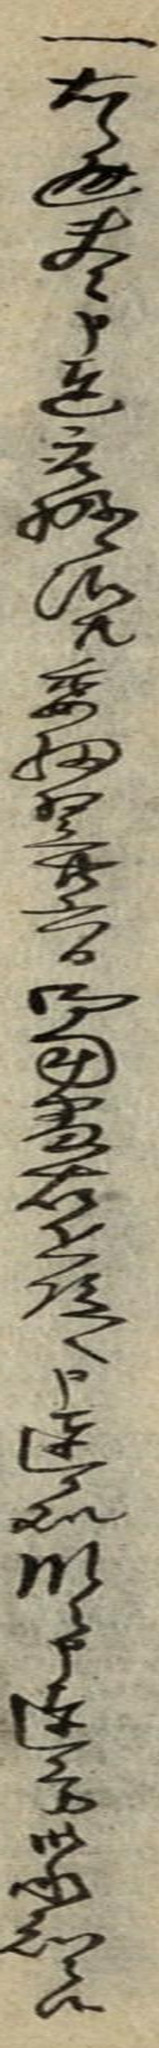一右之通夫々申達取扱候得共委細翌廿六日御用番右近殿へ申達候処御申達方御承知に候
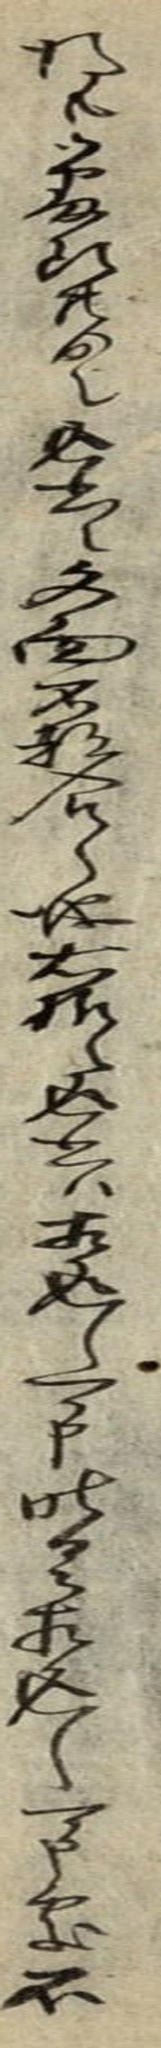得共御番頭共ゟ之返書之文面不都合之儀右様之返書は相返し可申昨日に相返し可申候処不
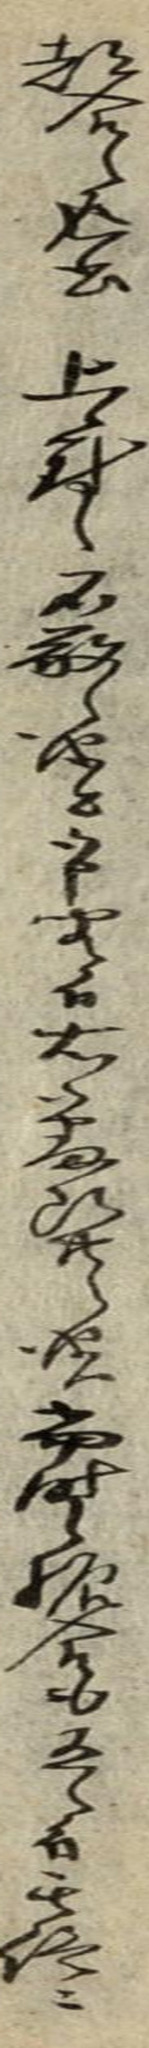都合之返書上に対し不敬之儀と御申聞候付右御番頭共之儀は当時之振合も有之候に付其侭
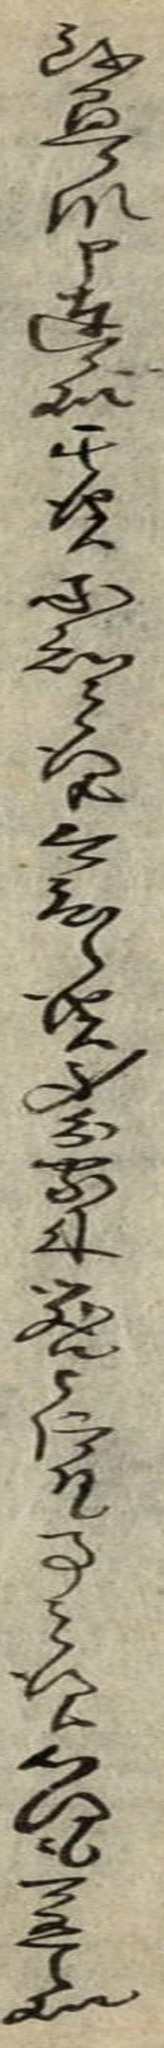致置候段申達候処其儀は承知に候得共今度之儀は身分家来御咎被仰付候事に候得は心得可有之処
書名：蒐輯之部
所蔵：福井県文書館 Fukui Prefectural Archives
